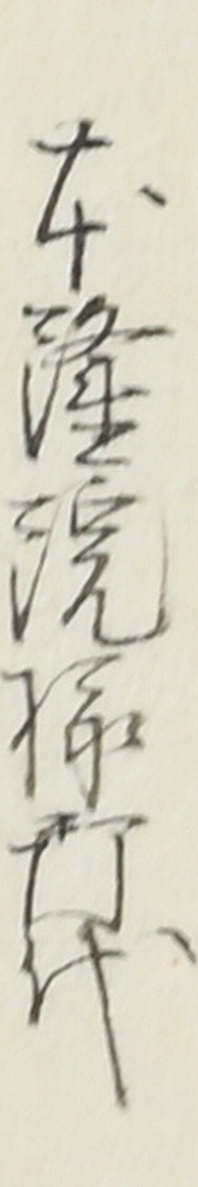本隆院様御代
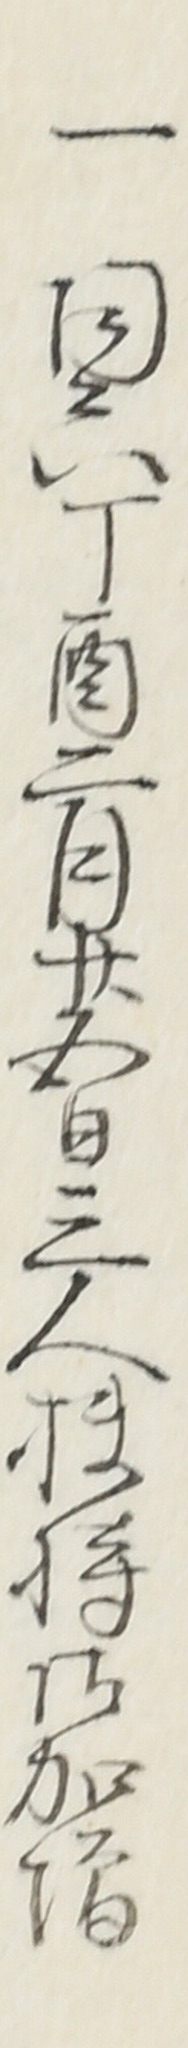一同六丁酉二月廿五日三人扶持御加増
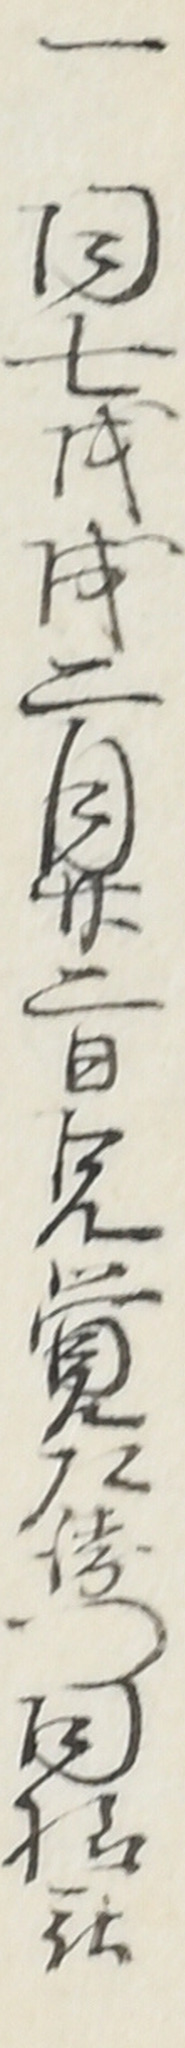一同七戌二月廿二日兄覚左衛門同様被
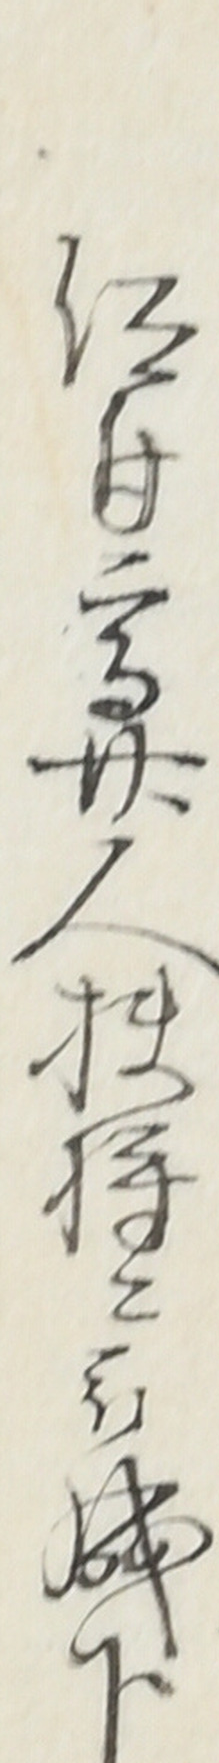仰付高廿人扶持ニ被成下
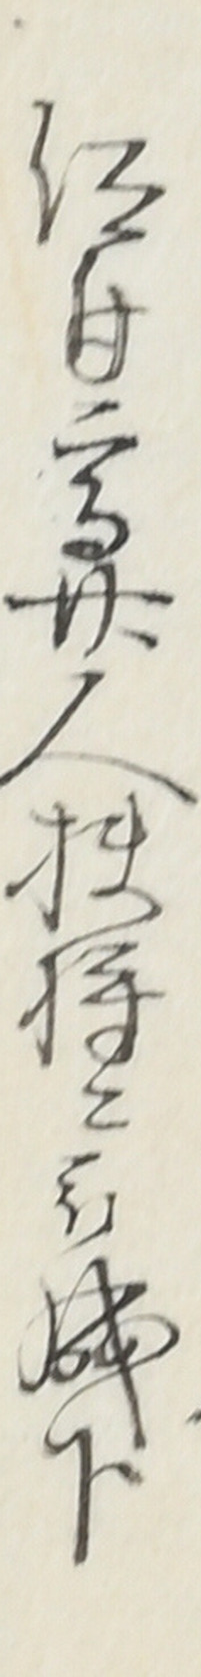仰付高廿人扶持ニ被成下
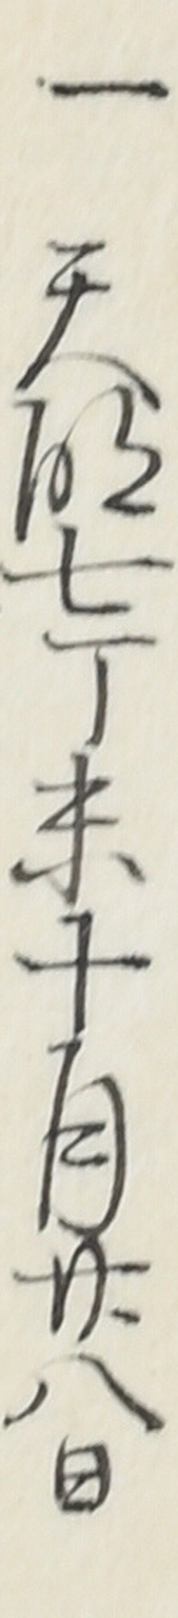一天明七丁未十月廿八日
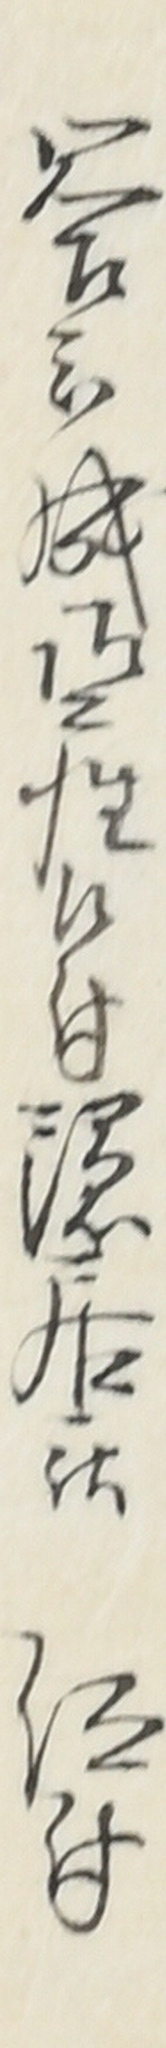思召被成御座候付隠居被仰付

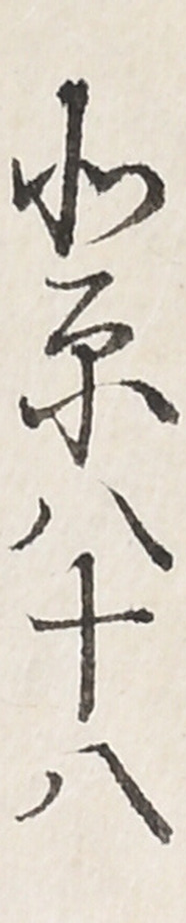北原八十八
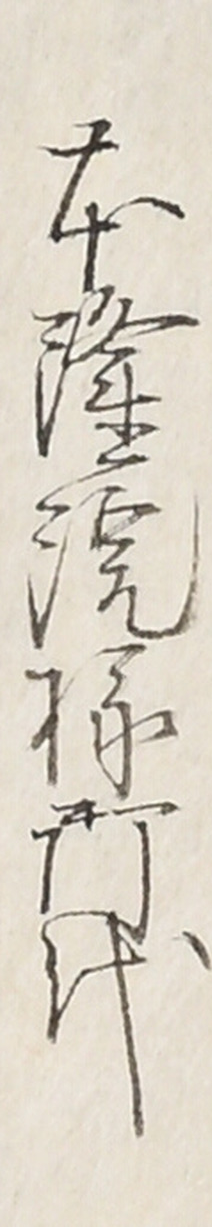本隆院様御代
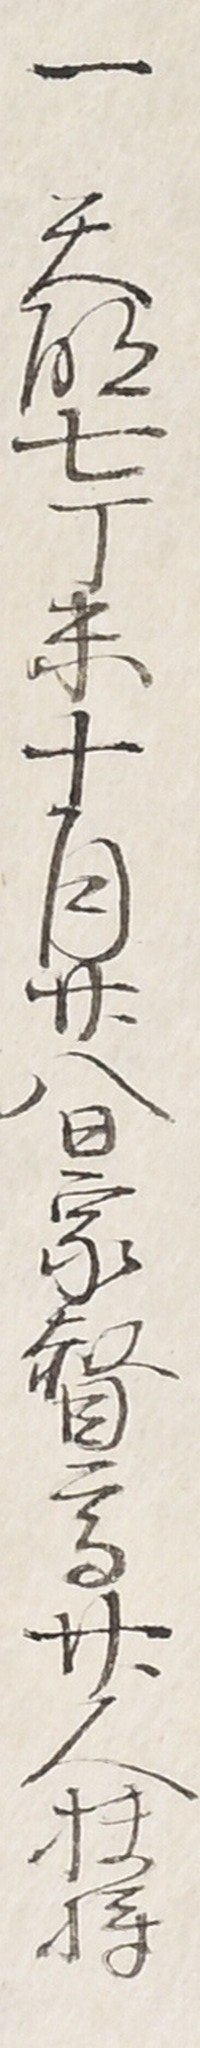一天明七丁未十月廿八日家督高廿人扶持
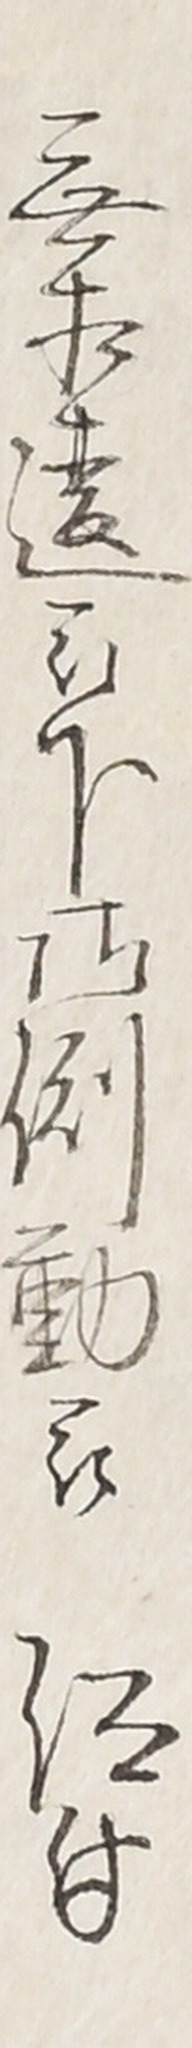無相違被下御側勤被仰付
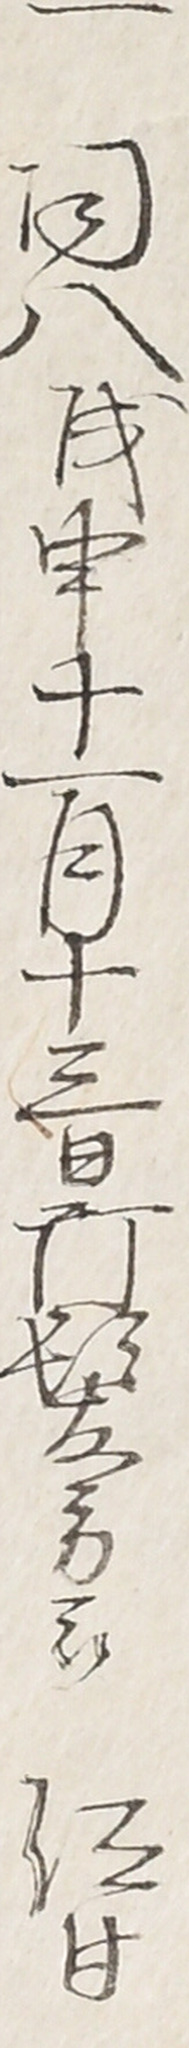一同八戊申十一月十三日御髪方被仰付
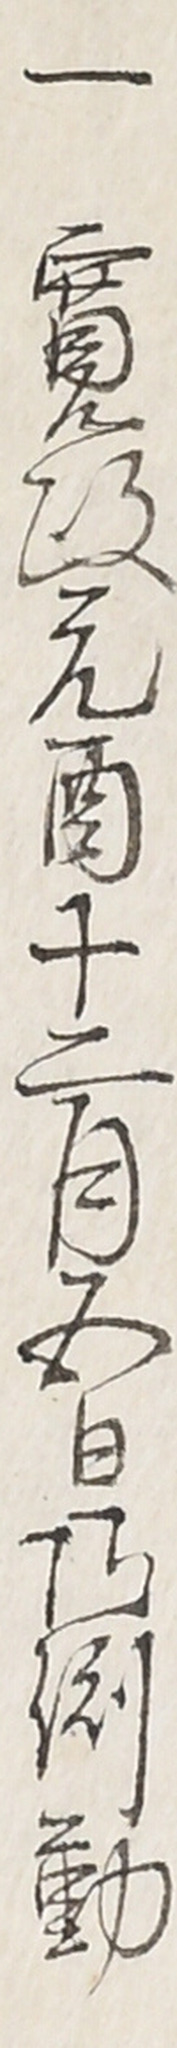一寛政元酉十二月五日御側勤
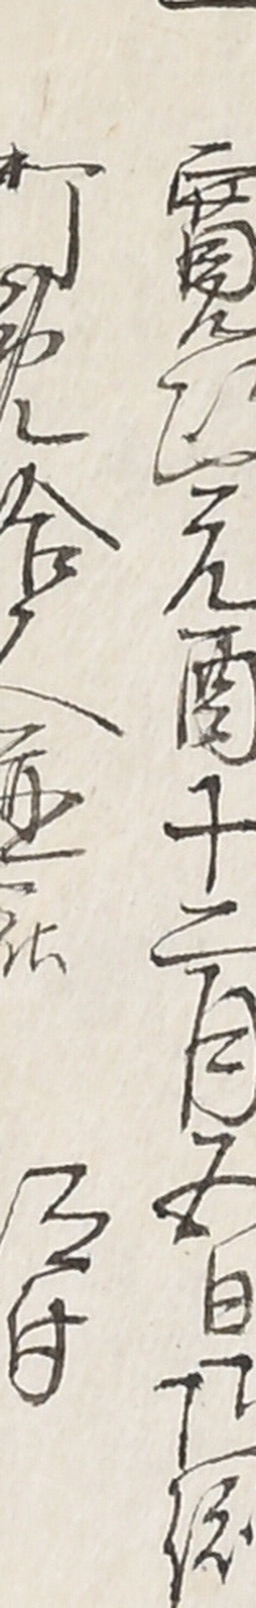御免給人並被仰付
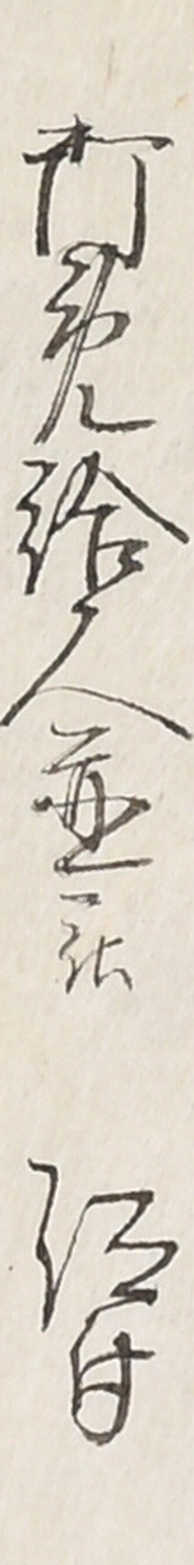御免給人並被仰付
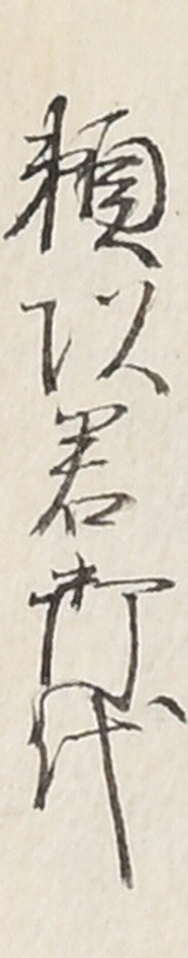頼以君御代
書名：給人諸士勤仕録（七）
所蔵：伊那市立高遠町図書館・合同会社AMANE
